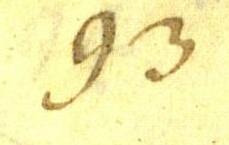93
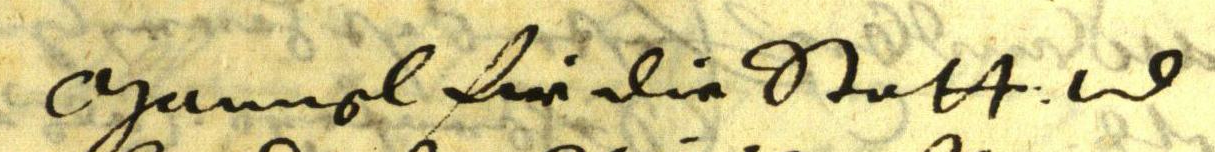Manngl fir die Statt: vnd
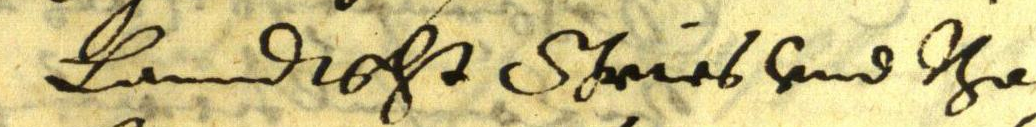Lanndtght Gries vnd Bozen
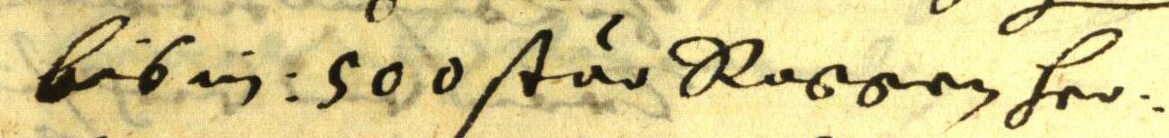bis in: 500 stār Roggen her¬
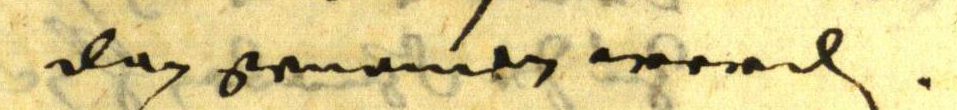dan genomen werd.
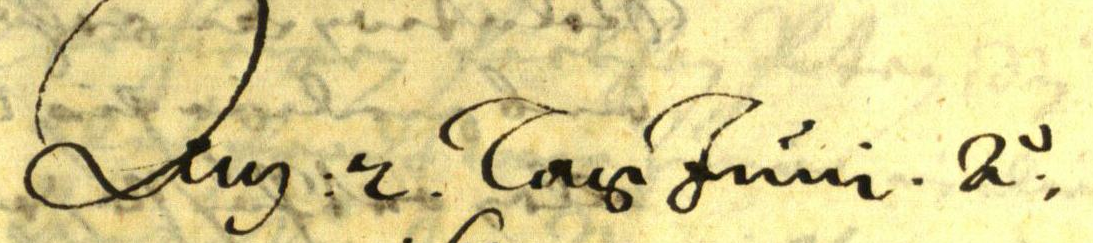Am: 2. Tag Jūni. Ao.
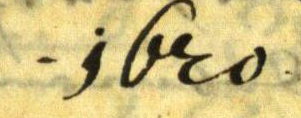.1620
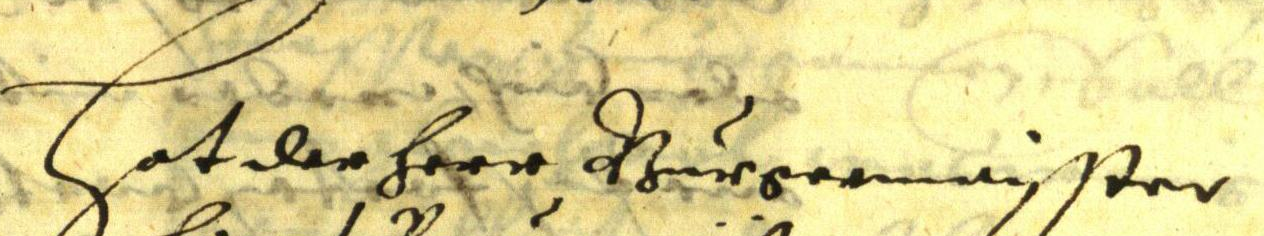Hat der herr Būrgermaisster
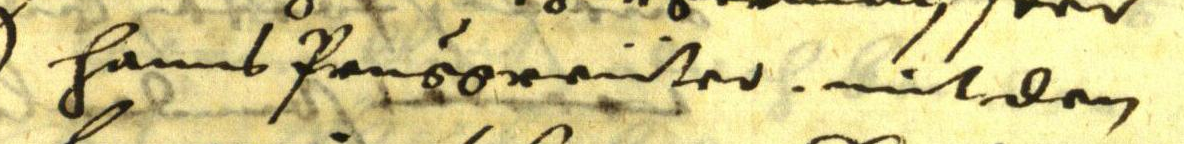hanns Prūggreüter. mit den
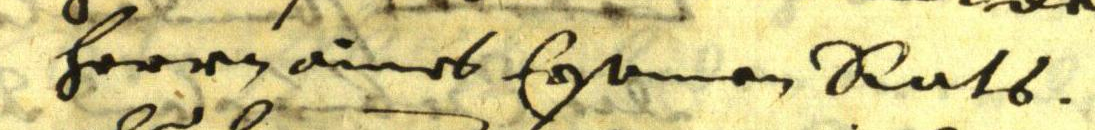herrn aines Ersamen Rats.
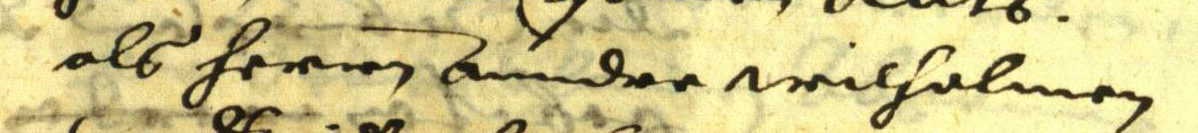als herrn Anndre Wilhalmen
